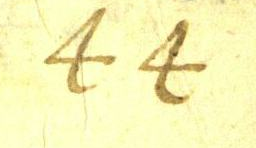44
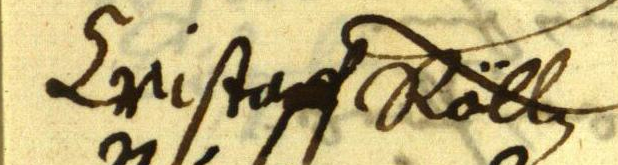Cristoff Kölln
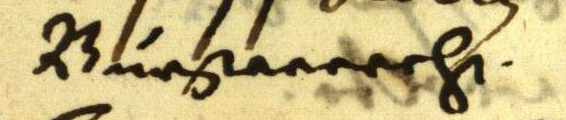Būrgerrecht.
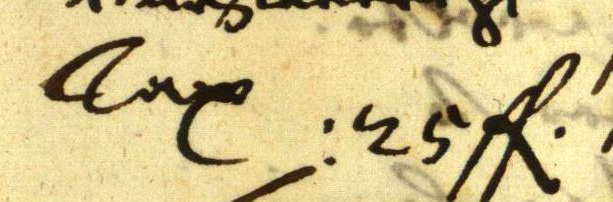Tax —: 25 fl.
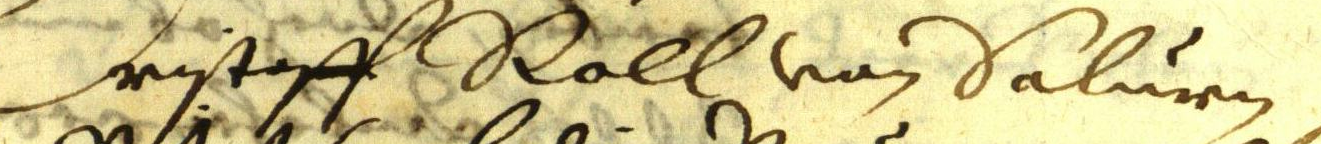Cristoff Kōll von Salūrn
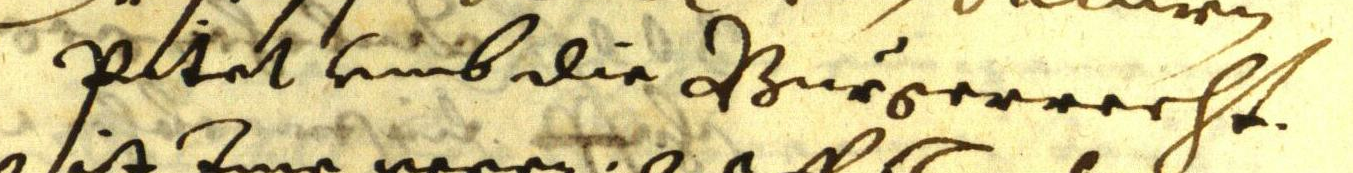Pitet umb die Būrgerrecht.
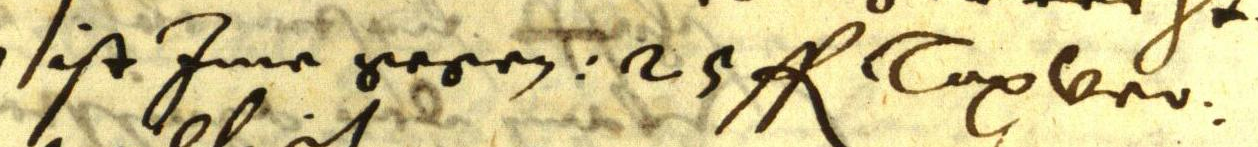ist Ime gegen: 25 fl Tax ver¬
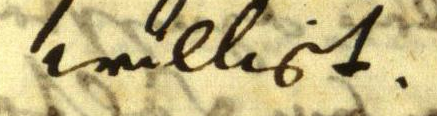willigt.
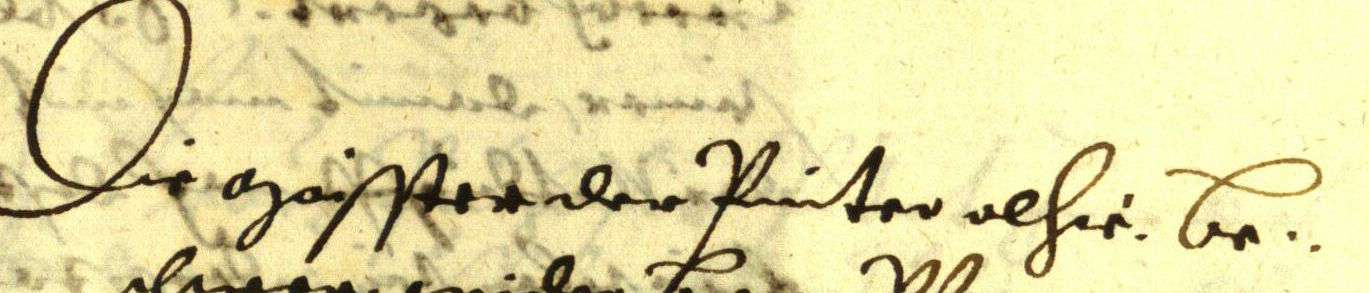Die Maisster der Pinter alhie. be¬
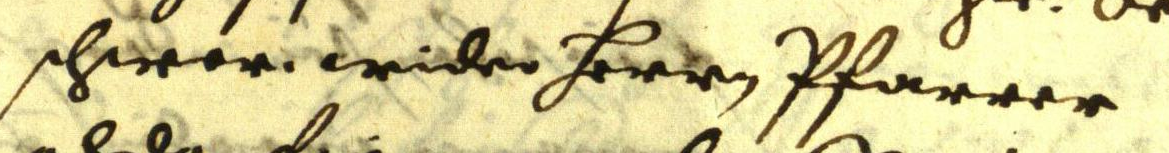schwer. wider herrn Pfarrer
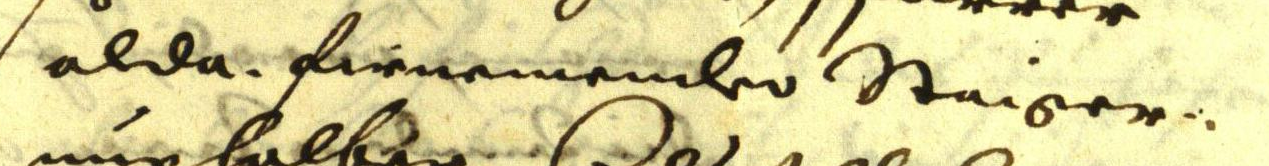alda. firnemenden Staiger¬
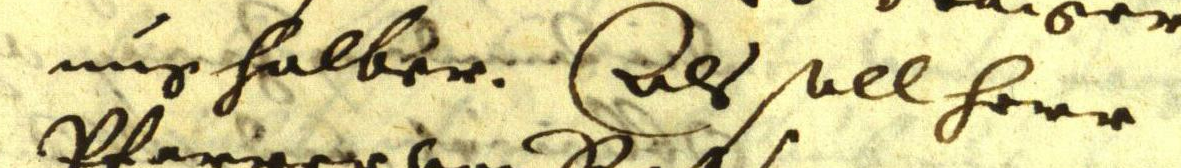ūng halber. Als soll herr
